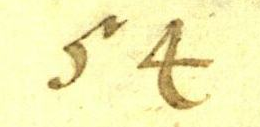54
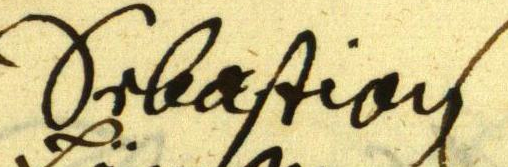Sebastian
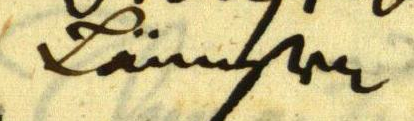Lännser
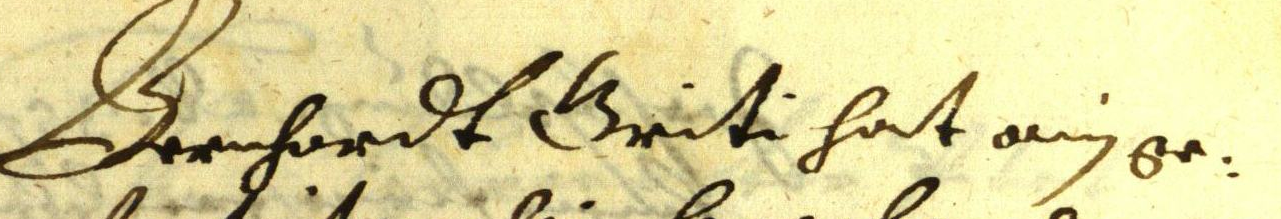Bernhardt Griti hat ain ge¬
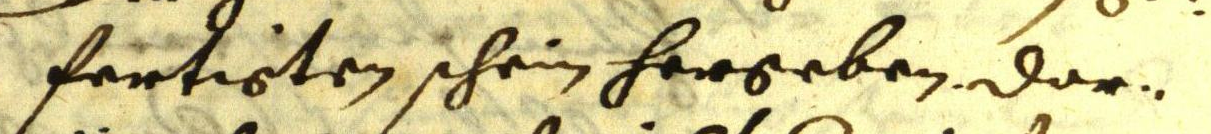fertigten schein hergeben. dar¬
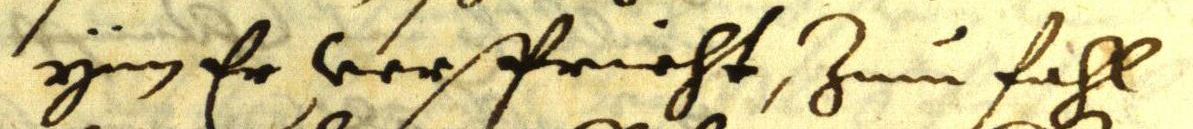ÿnn Er verspricht, Zūm fahl
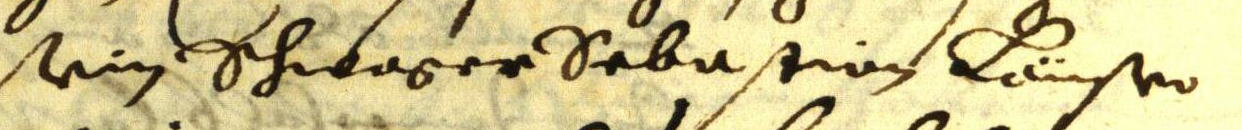sein Schwager Sebastian Länser
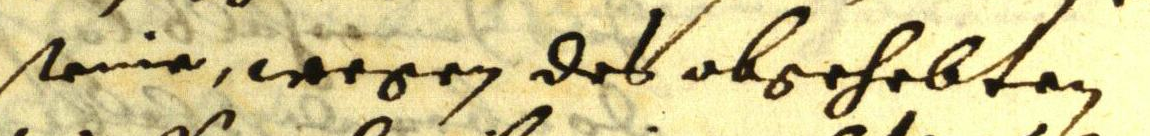seiner, wegen des abgehebten
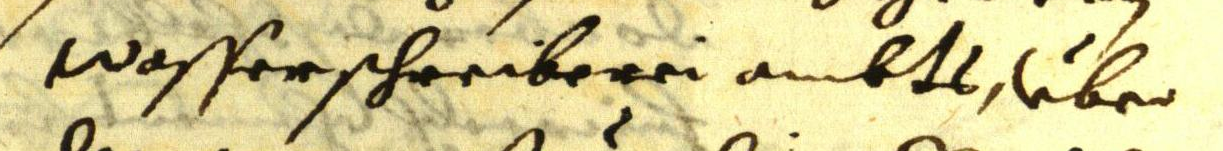Wasserschreiberei ambts, v̄ber
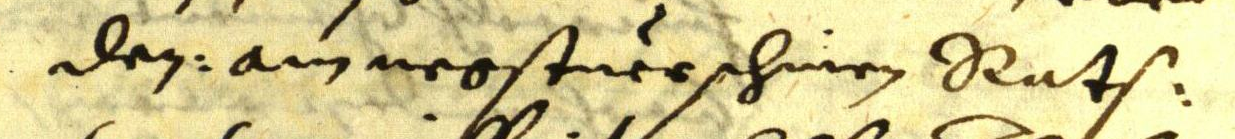den: am negstvērschinen Rats¬
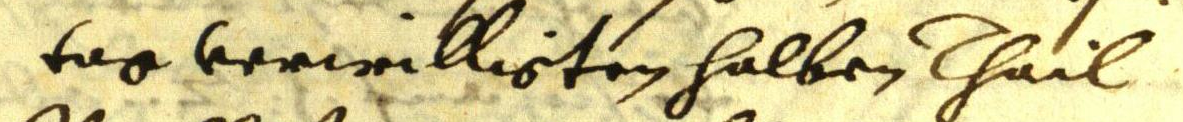tag verwilligten halben Thail
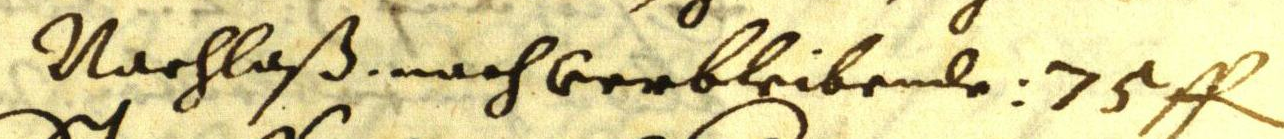Nachlaß. noch verbleibende: 75 fl
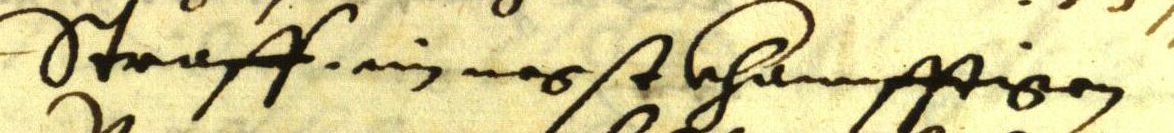Straff. im negst khonnfftigen
